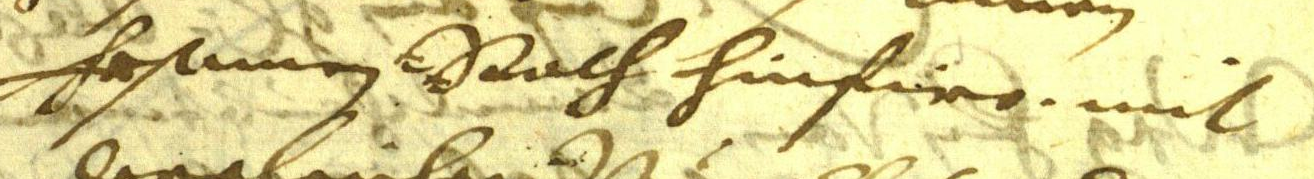Ersamen Rath hinfiro. mit
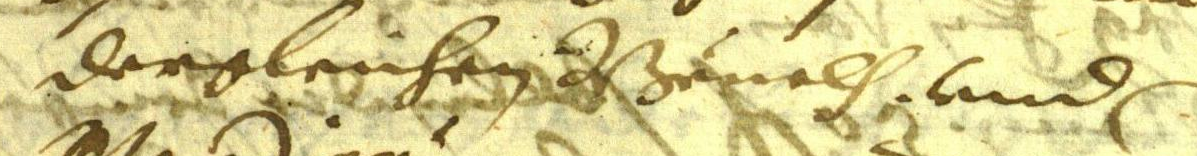derogleichen Beūelh. vnd
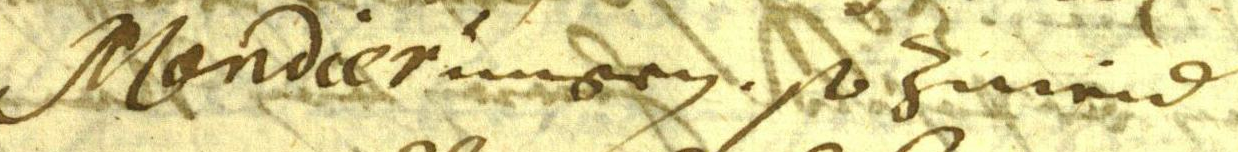Mandierūngen. so Zuwid
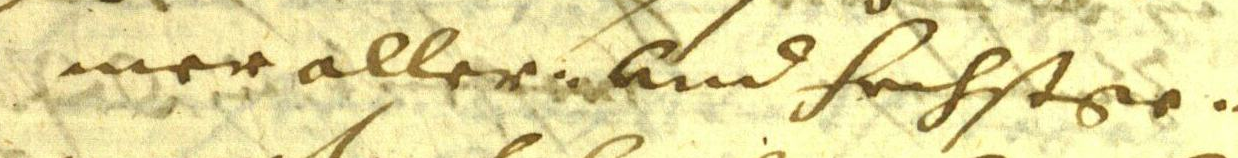mer aller: vnd hechstge¬
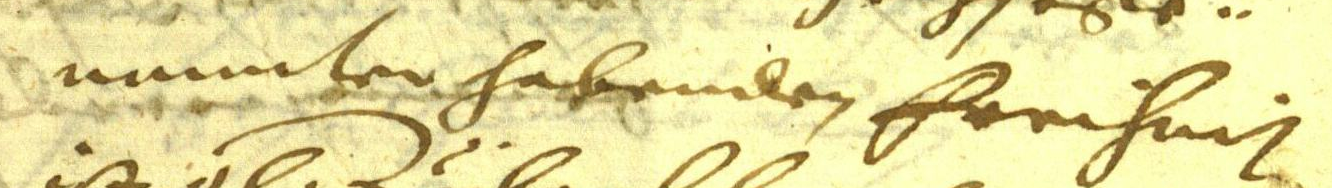nannten habenden Freihait
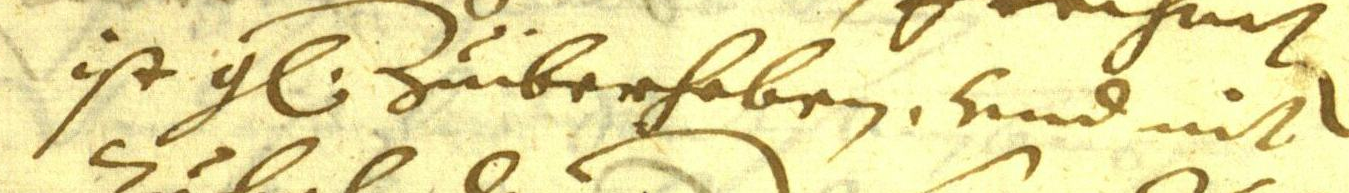ist g: Zūiberheben. vnd nit
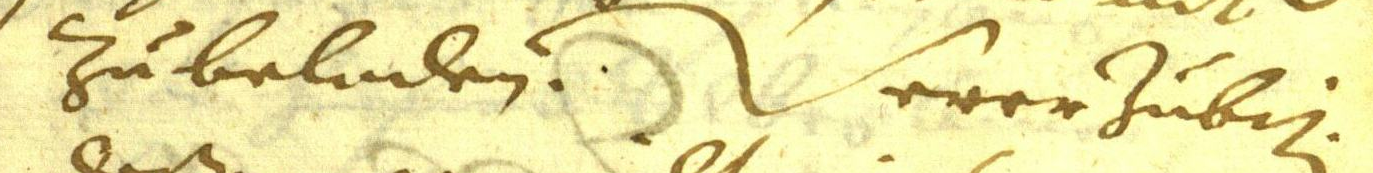Zūbeladen. Verer Zūbit.
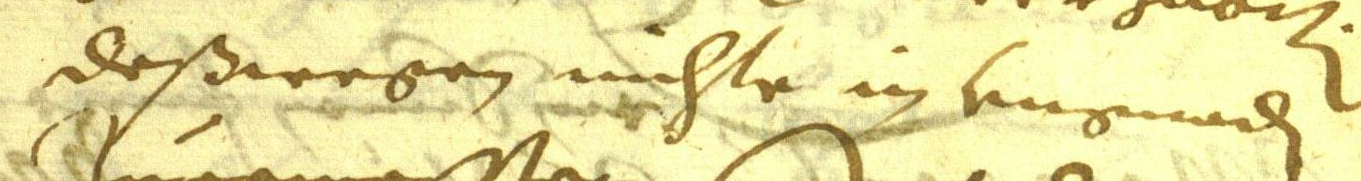deßwegen nichte in vngnad
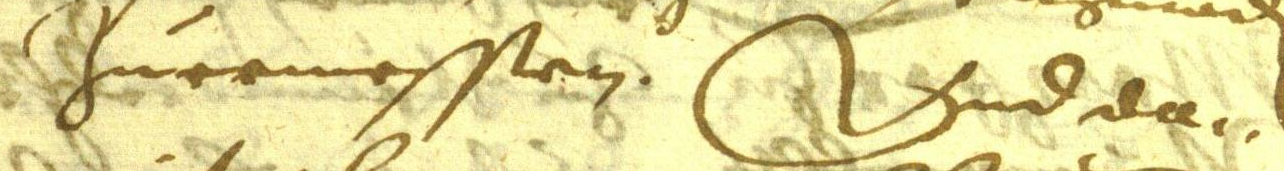Zūermessen. Vnd da¬
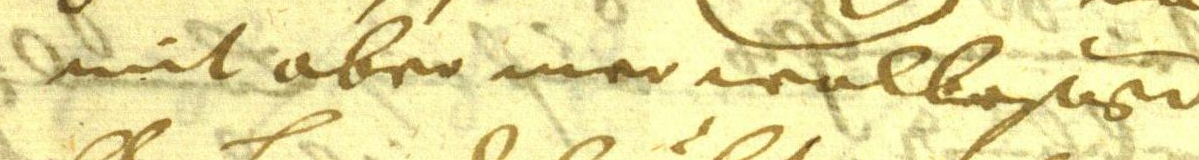mit aber mer wolbesagt
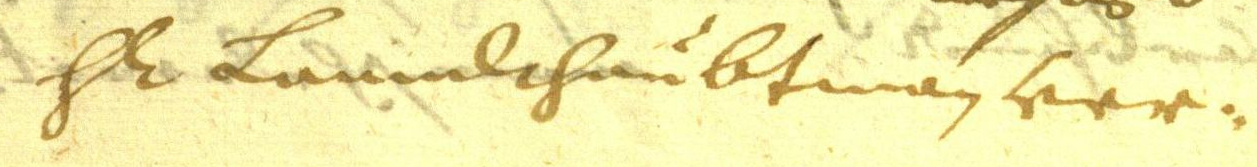hl Lanndthaūbtman ver¬
